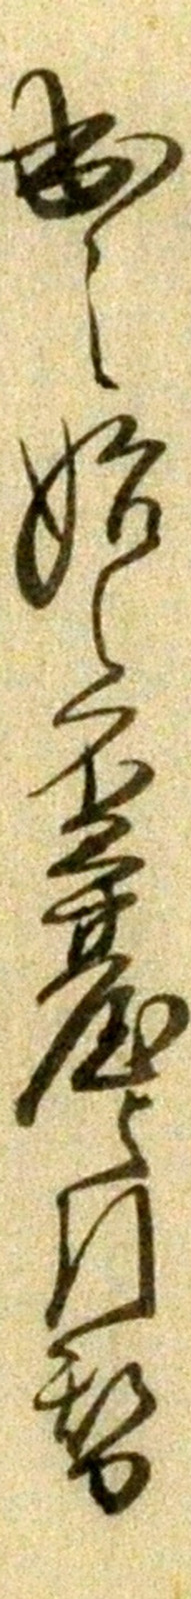出之始之盃台と引替
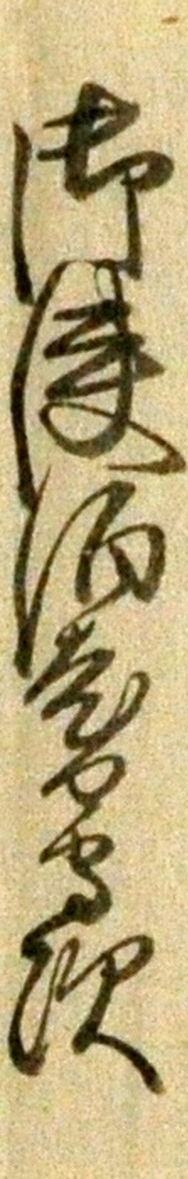御使伯耆守次
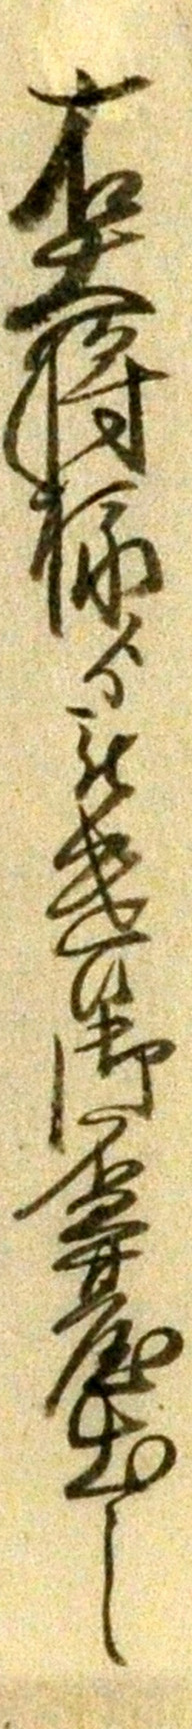右大将様ゟ被遣候御盃台出之
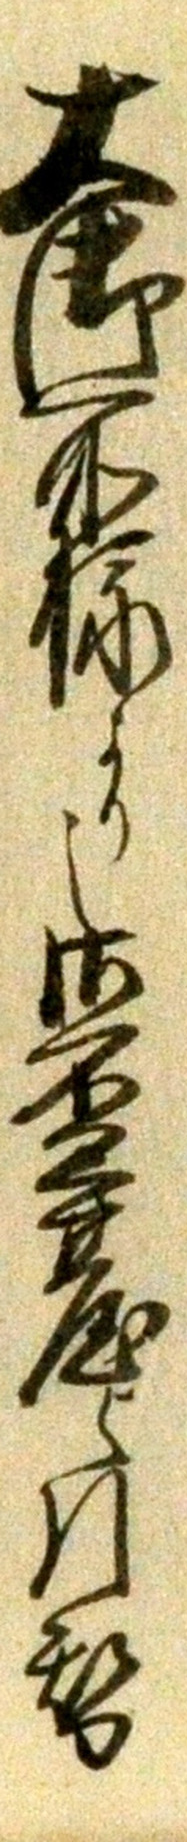大御所様より之御盃台と引替
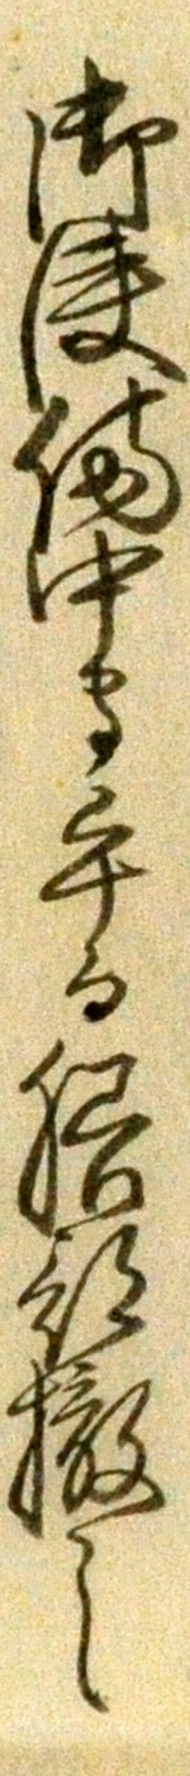御使備中守畢而膳部撤之
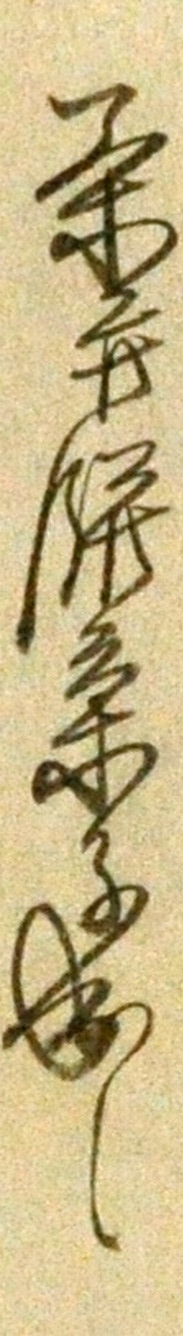茶并餅菓子出之
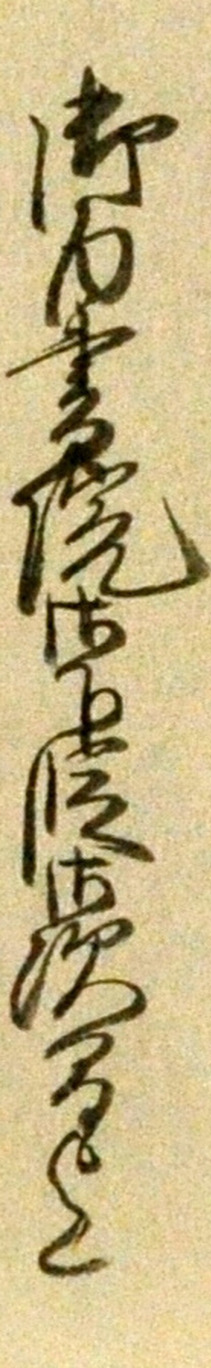御白書院御下段御次間迄
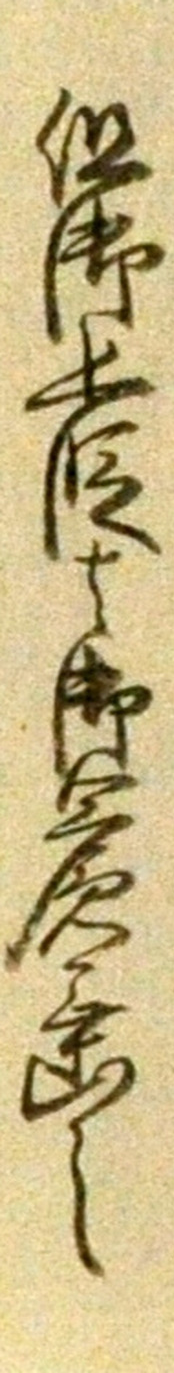但御上段は御簾垂之

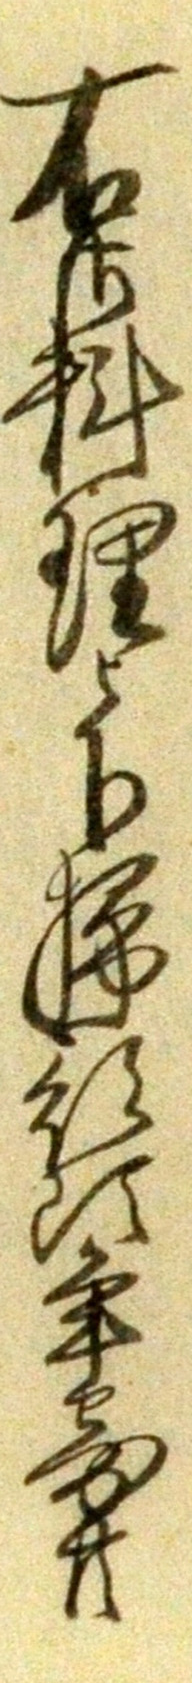右御料理被下掃部頭年寄共
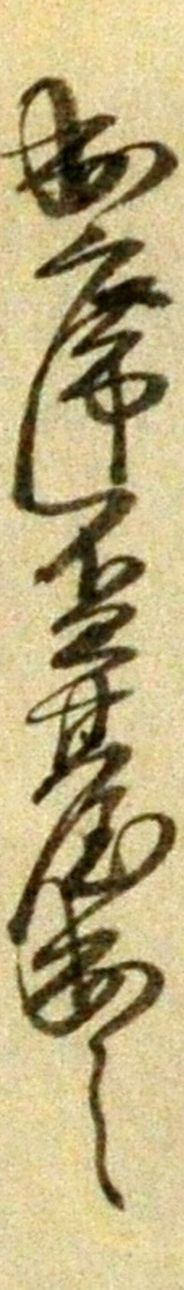出席盃台出之
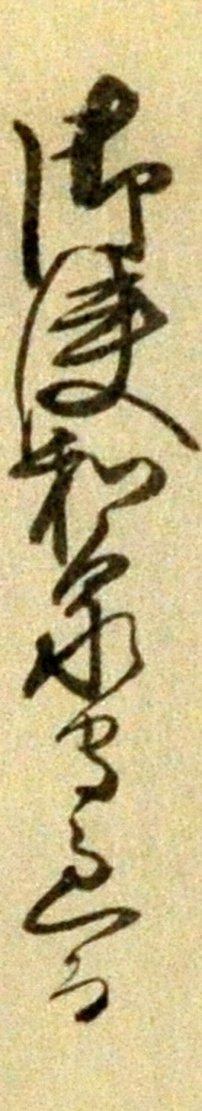御使和泉守過而
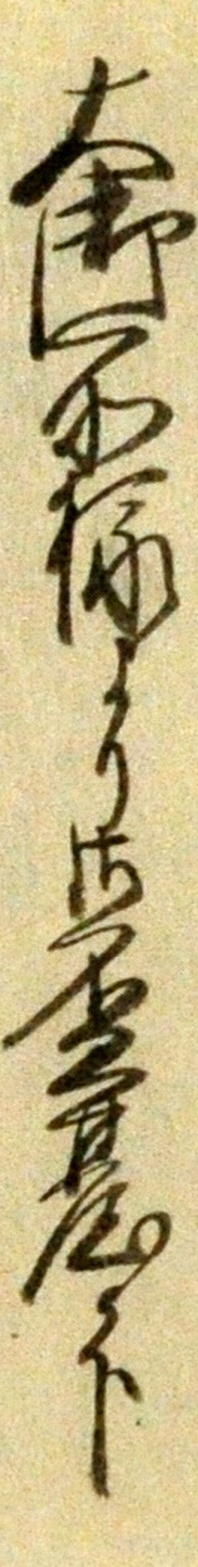大御所様より御盃台被下
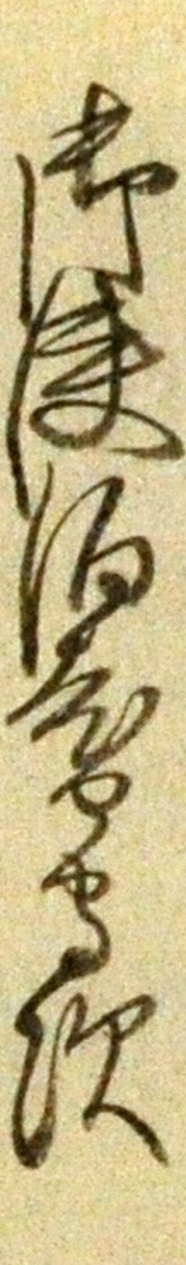御使伯耆守次
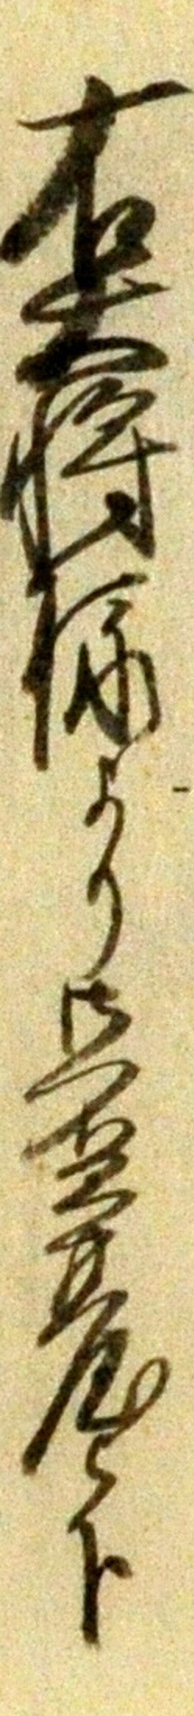右大将様より御盃台被下
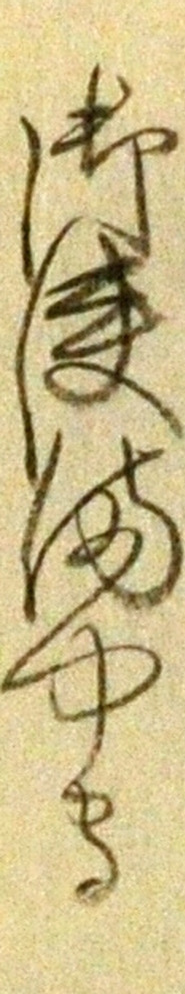御使備中守
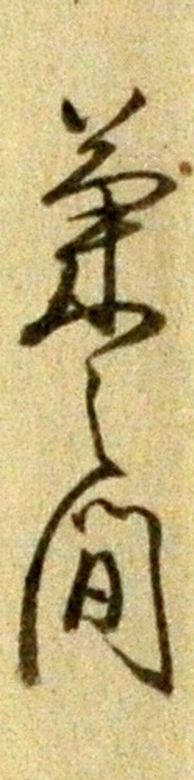菊之間
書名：御馳走御能ノ節ノ留外
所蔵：伊那市立高遠町図書館・合同会社AMANE
